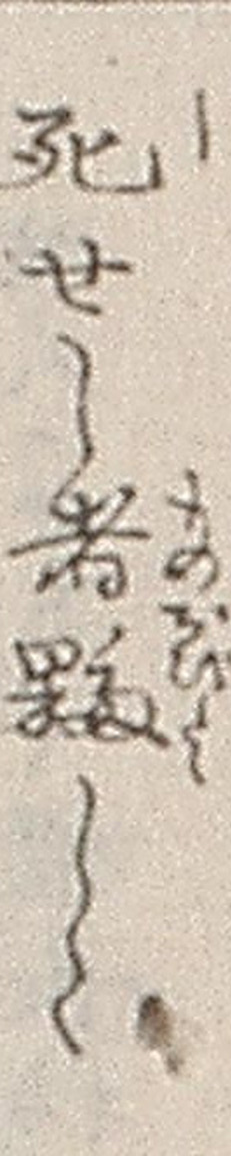死せし者夥しく
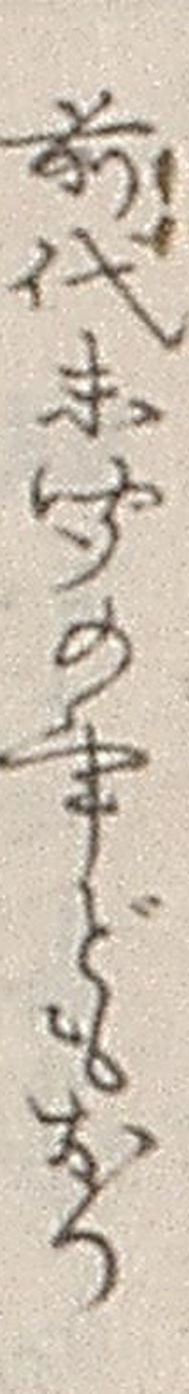前代未聞の事どもなり
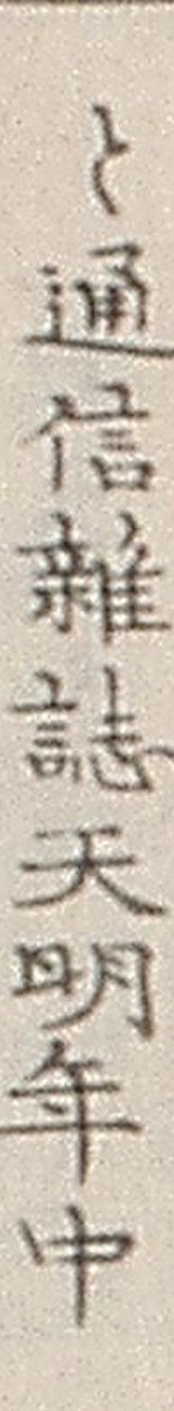と通信雑誌天明年中
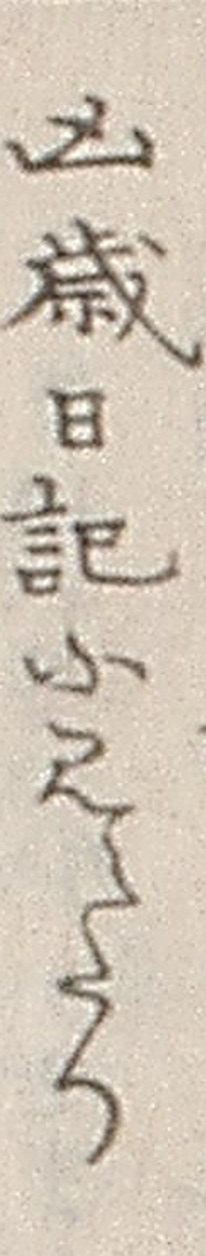凶歳日記に見えたり

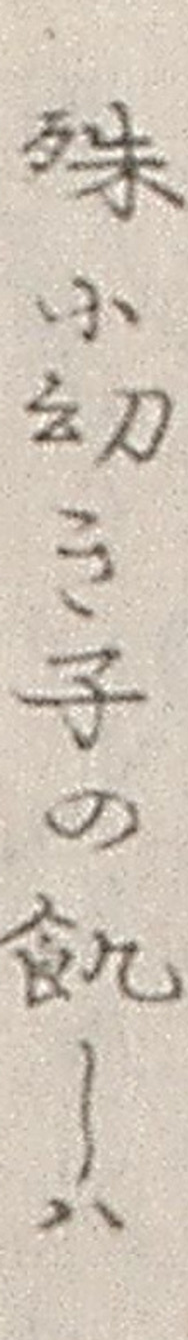殊に幼き子の飢しは
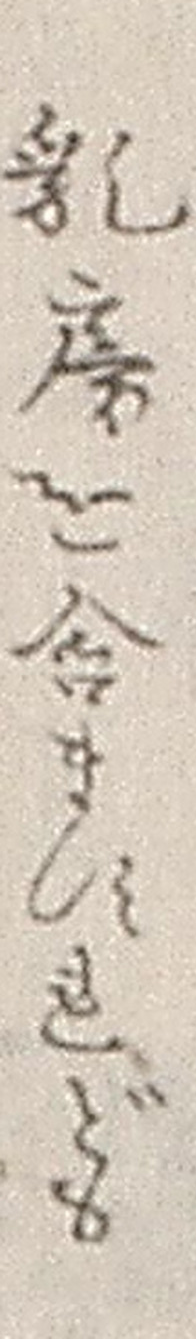乳房を含ますれども
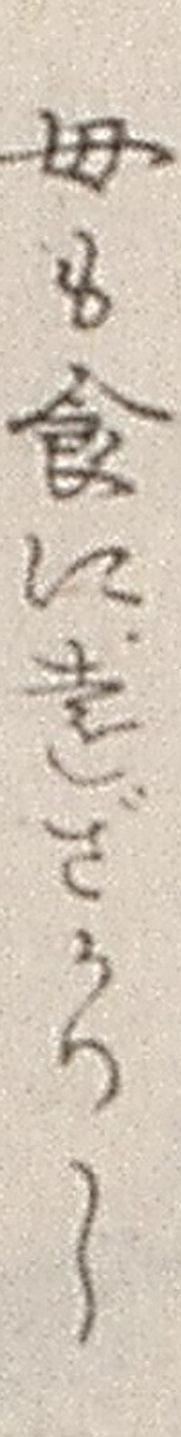母も食に遠ざかりし
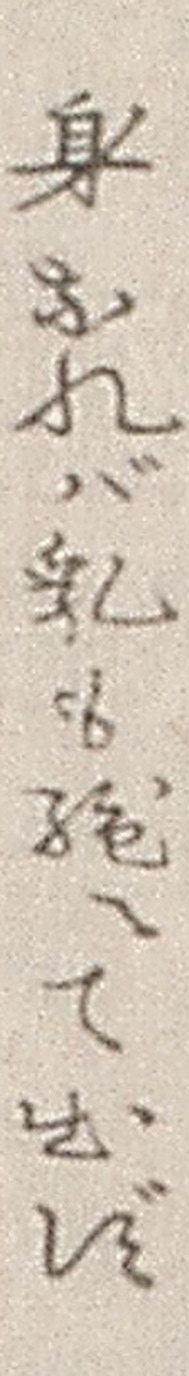身なれば乳も絶へて出ず
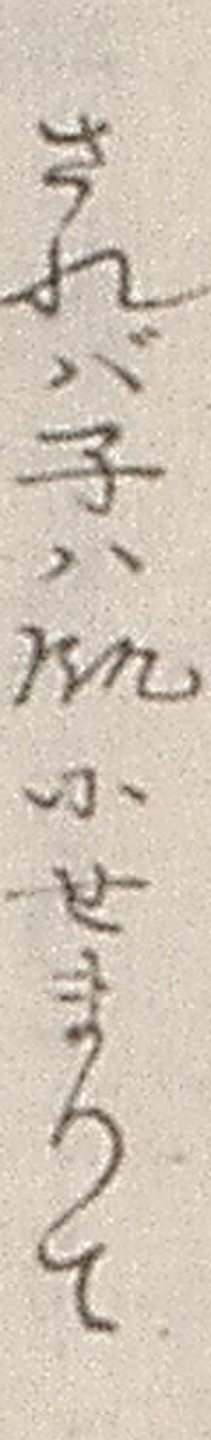されば子は飢にせまりて
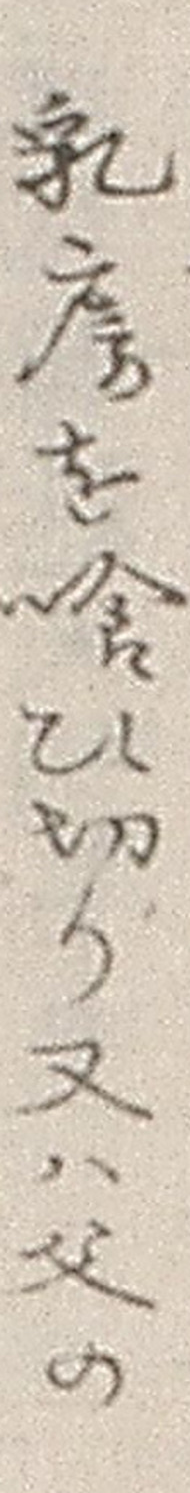乳房を喰ひ切り又は父の
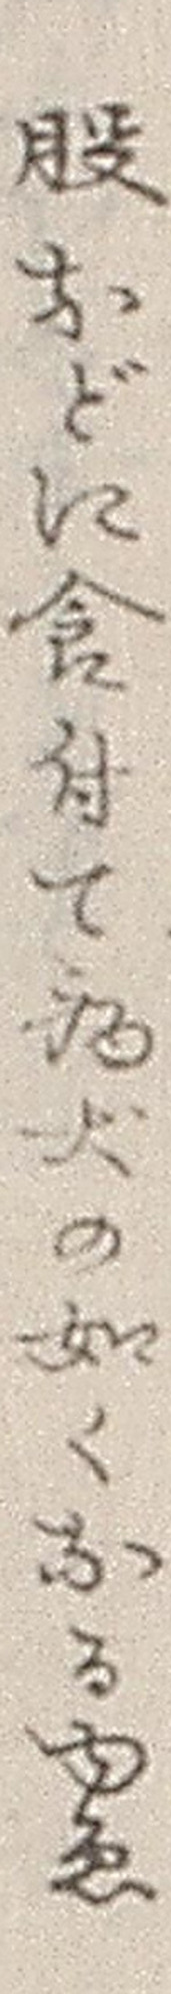股などに食付きて病犬の如くなるゆゑ
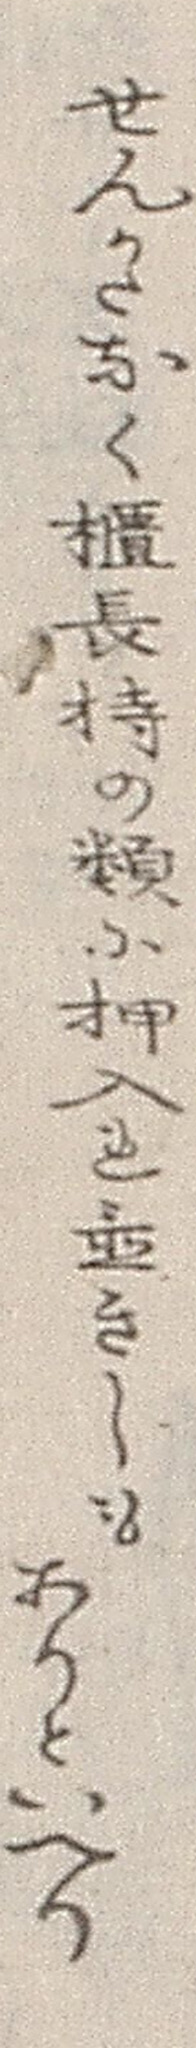せんかたなく櫃長持の類に押入れ置きしもありといへり

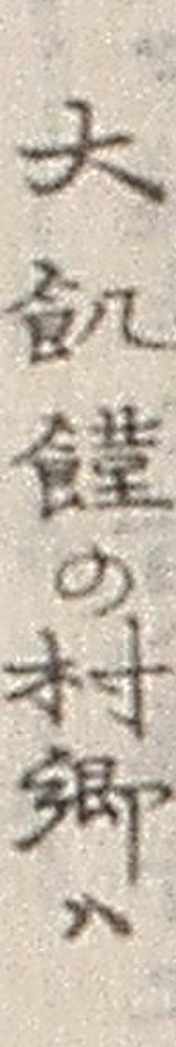大飢饉の村郷は
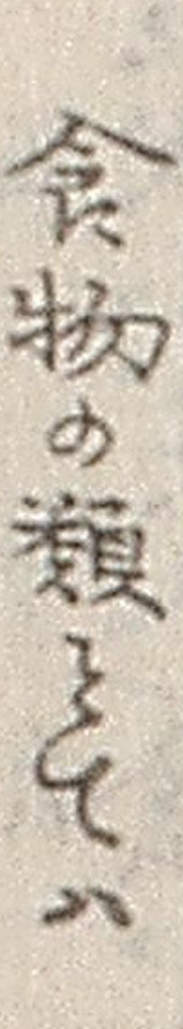食物の類とては
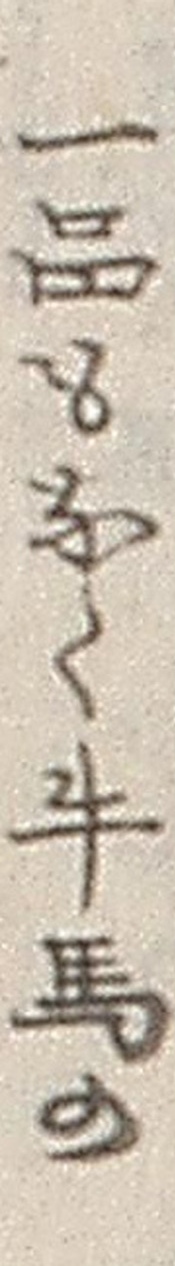一品もなく牛馬の
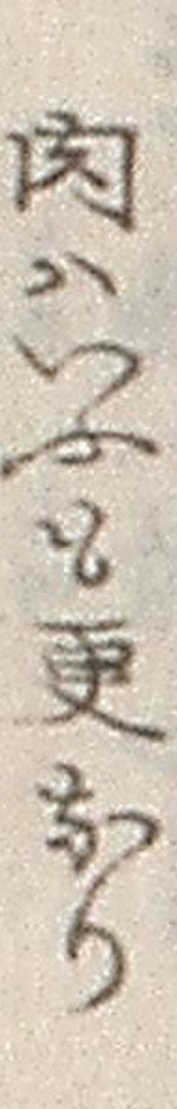肉はいふも更なり
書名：凶荒図録　完
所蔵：東京大学地震研究所図書室 Earthquake Research Institute Library, The University of Tokyo, JAPAN
